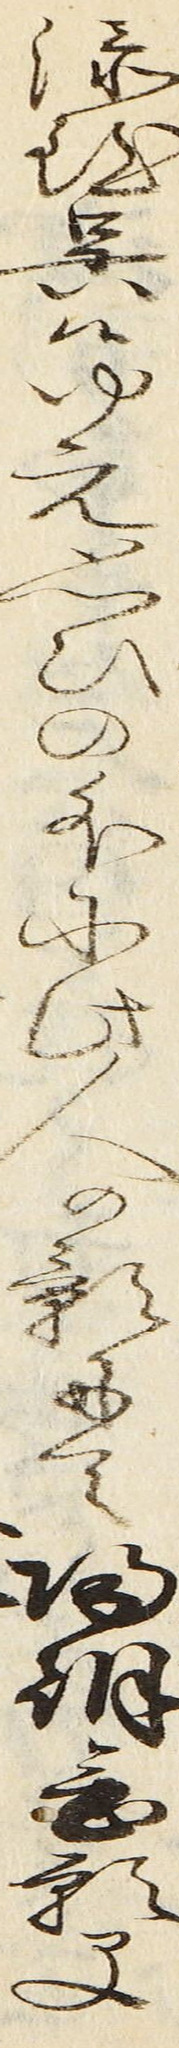添致呉候ゆえ思ひの外に此人の影にて帰朝念願早
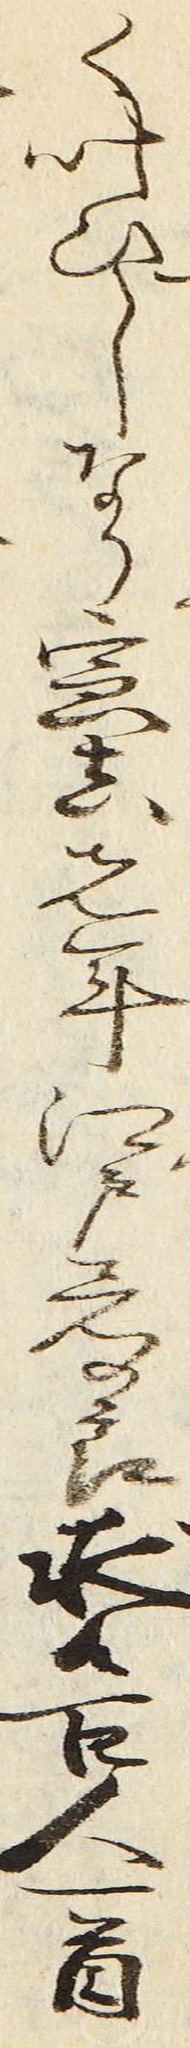く叶ひしなり寅吉先年江戸着の節求ル百人一首
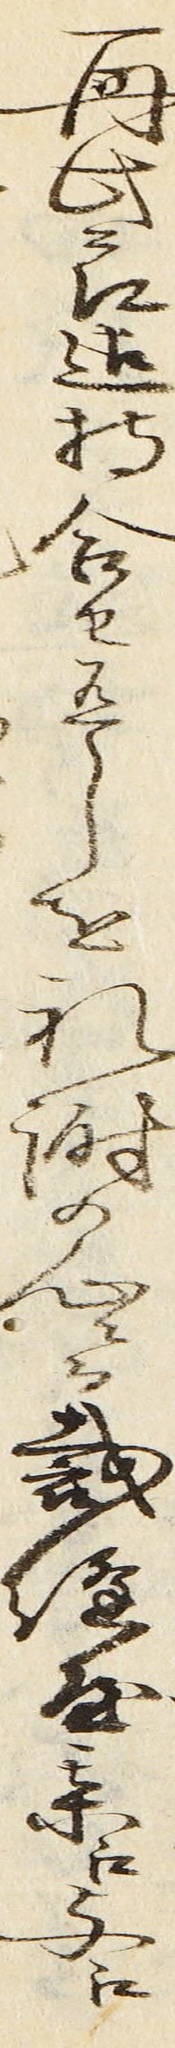再此節迄持合セ有しを礼謝の心ニ而裁縫屋某え与え
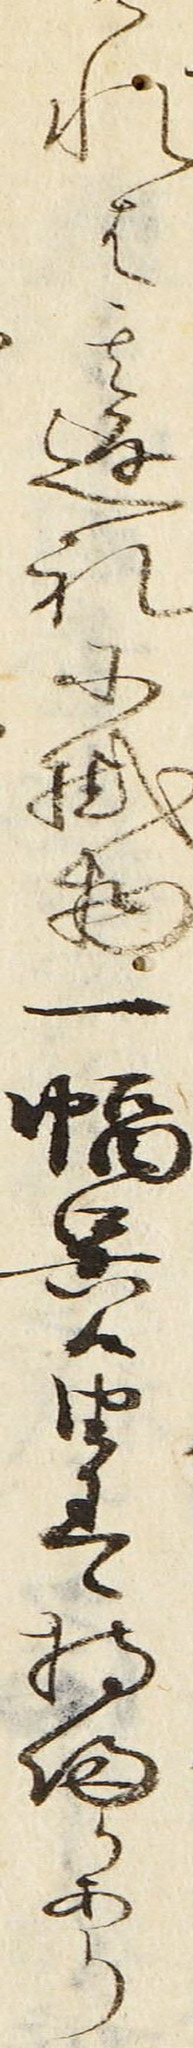けれは其返礼に掛物一幅呉候由にて持帰りあり
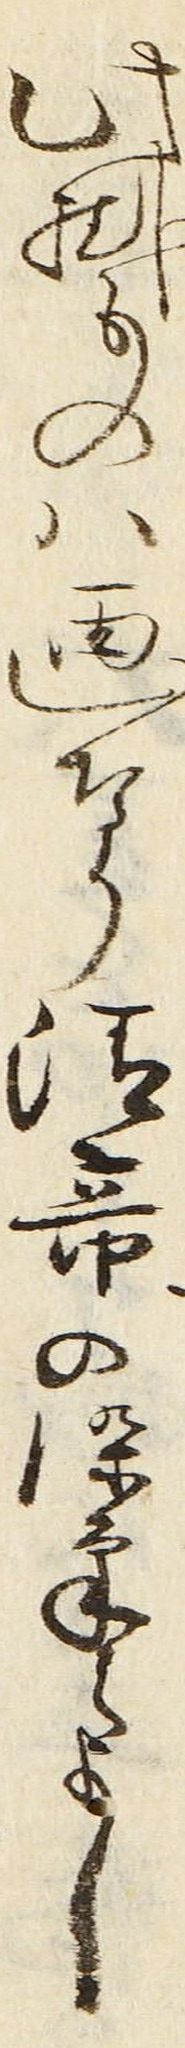此掛ものハ画なり清帝の染筆之よし
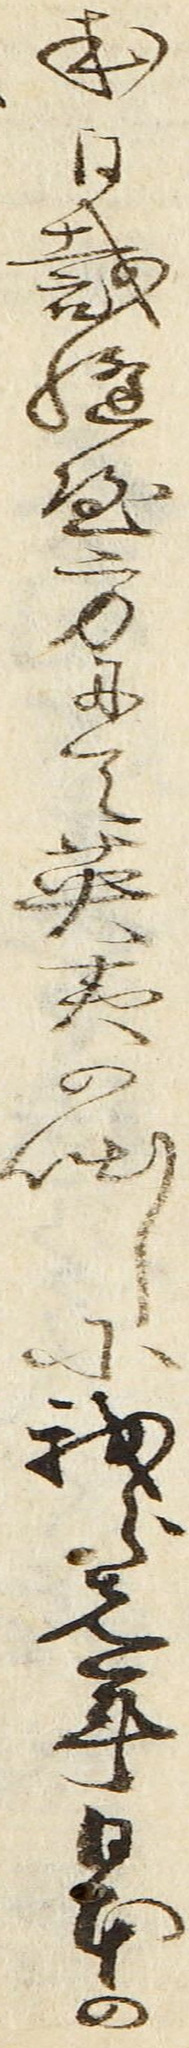本日裁縫屋方にて英夷の咄しに我ら先年日本の
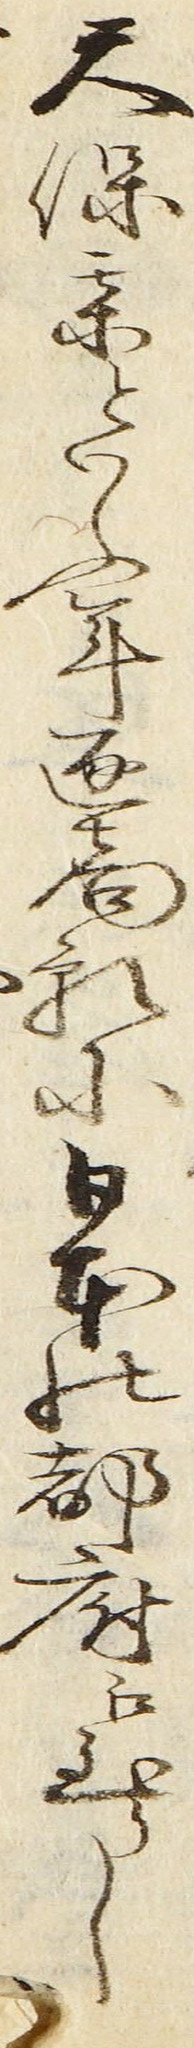天保某という年通商願に日本の都府え至りし
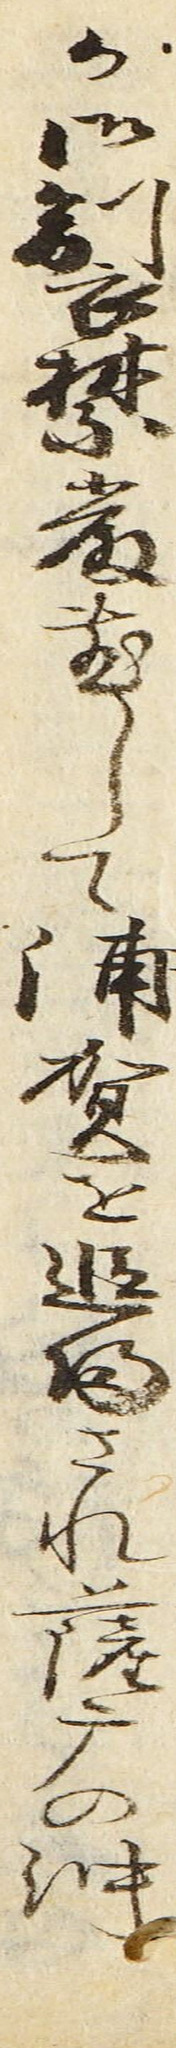が御製禁厳敷して浦賀を追帰され薩摩の沖

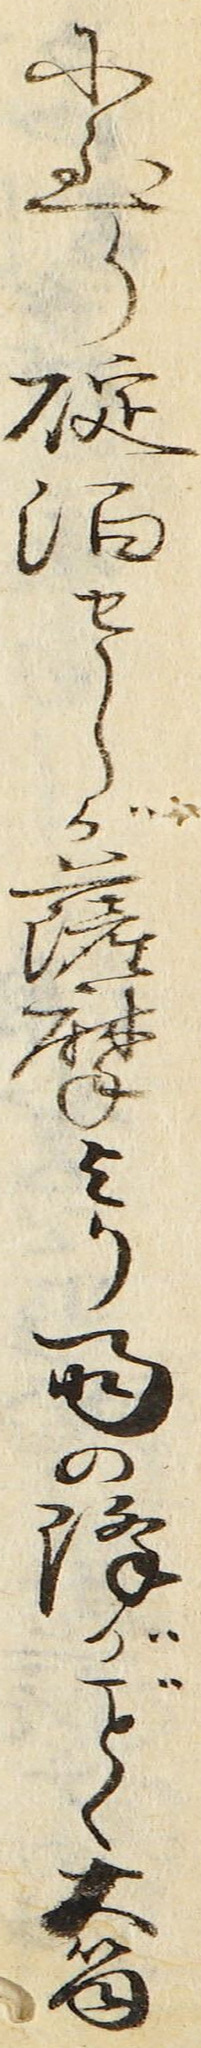に至り碇泊セしが薩摩より雨の降がごとく大筒
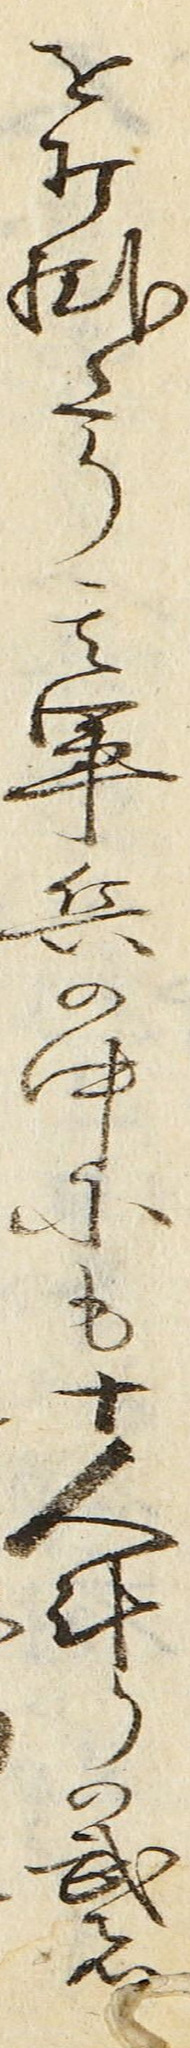を打掛たり其軍兵の中にも十人計りの武者
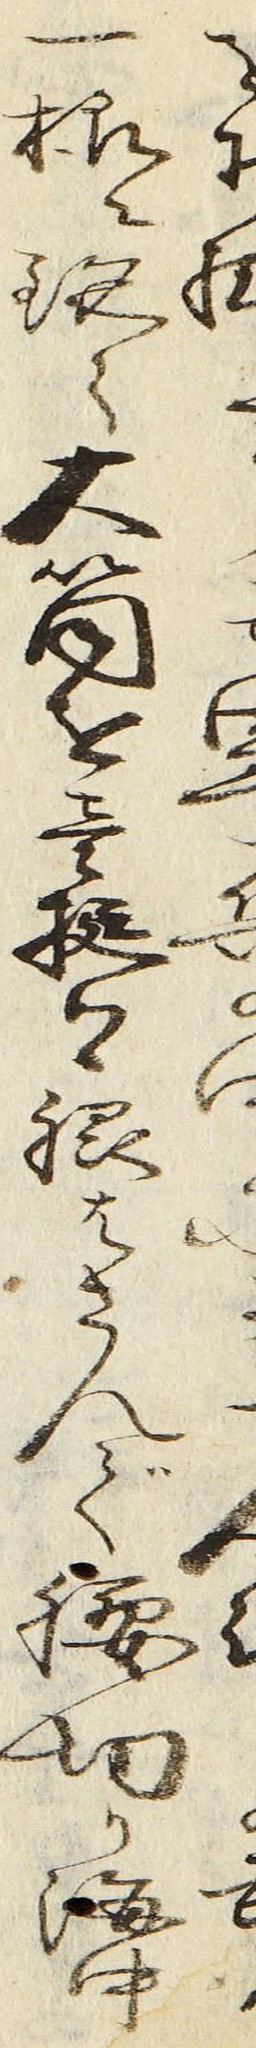一様ニ銘々大筒を壱挺ツヽ脇はさんで腰切り海中
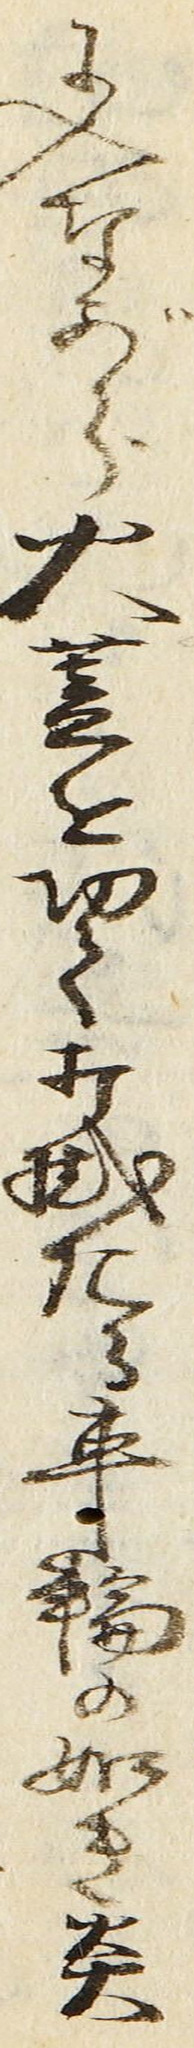に入ながら火蓋を切て打掛たる車輪の如き炎
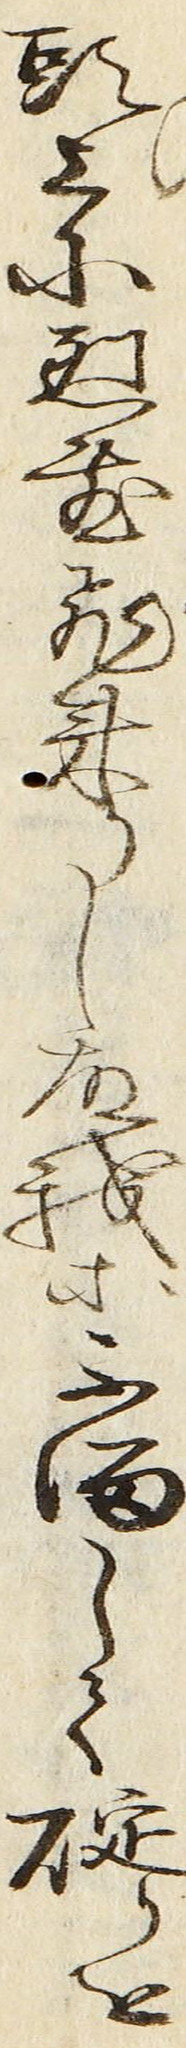頭上に烈敷飛来りし故我等不溜して碇りを
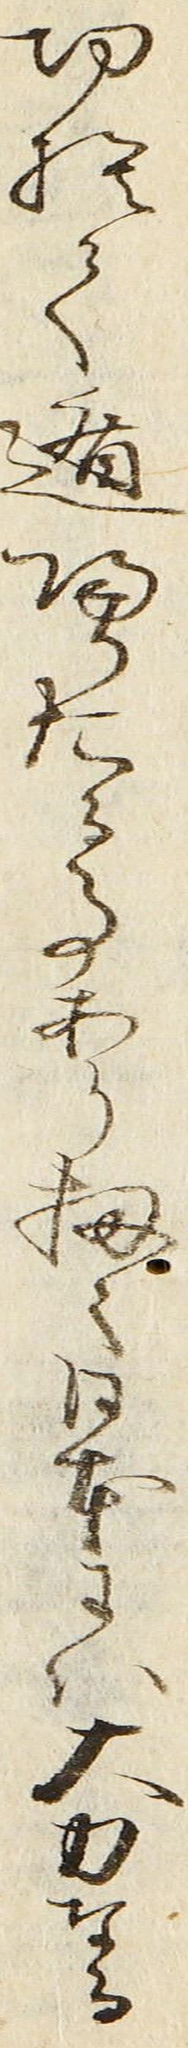切捨て遁帰りたる事あり扨々日本にハ大力なる
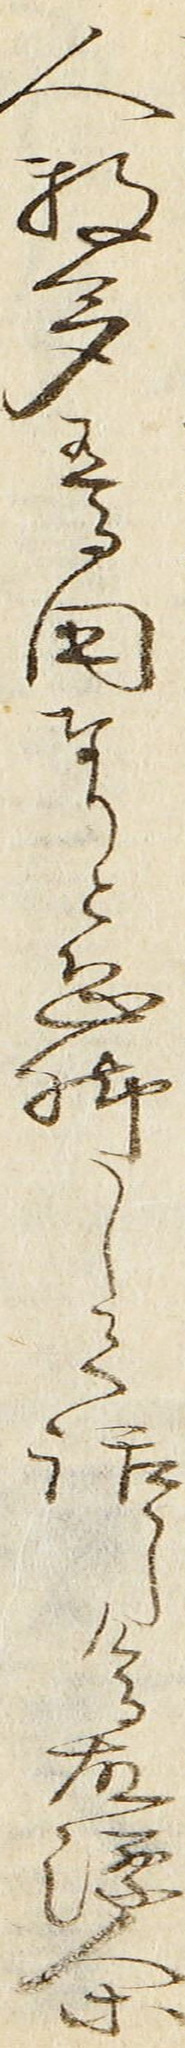人数多有る国なりと恐怖して話しける故漂人等
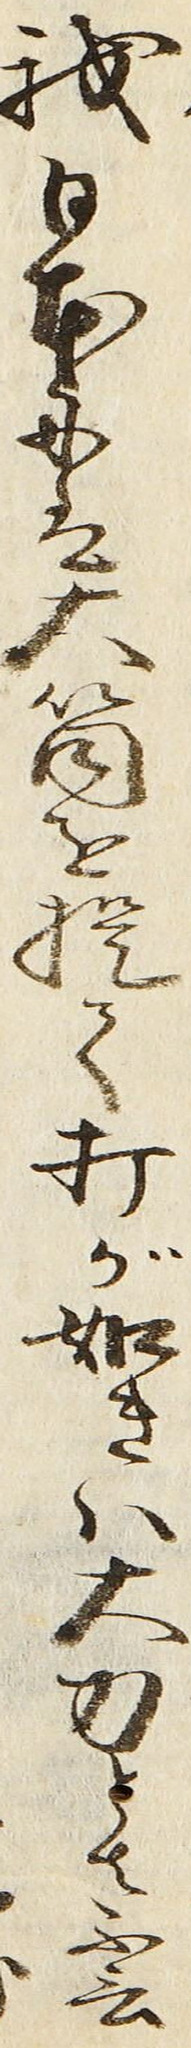我日本には大筒を提て打が如きハ大力とは不言
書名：亜墨利加漂流記聞
